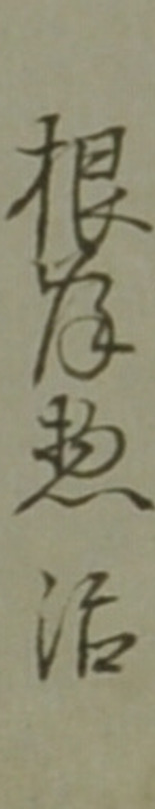根岸惣治
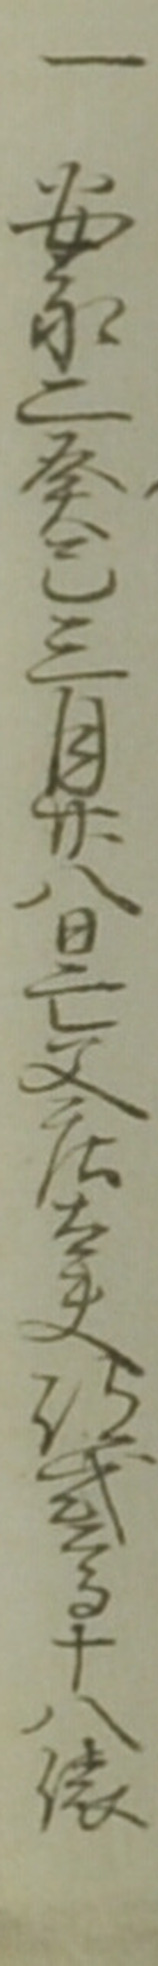一安永二癸巳三月廿八日亡父庄太夫跡式高十八俵

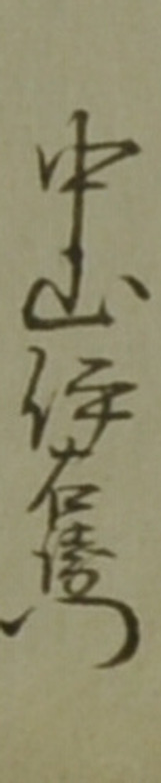中山伊右衛門
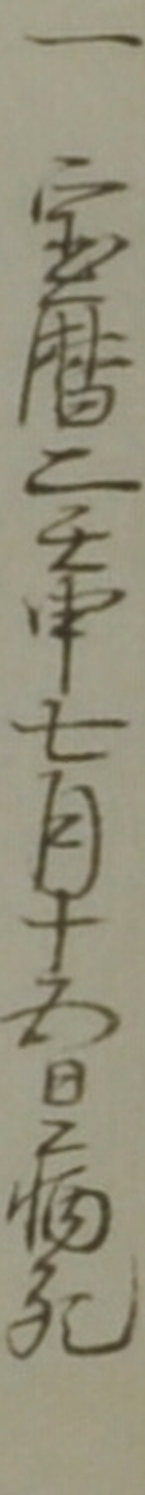一宝暦二壬申七月十五日病死
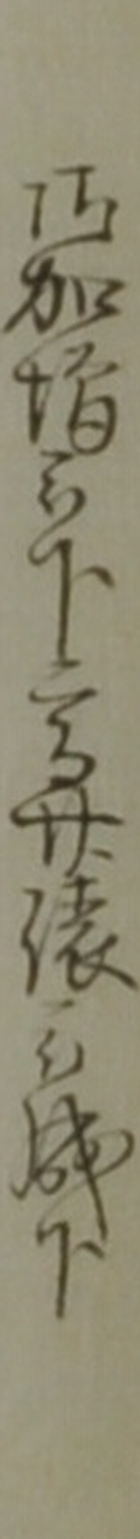御加増被下高廿俵被成下
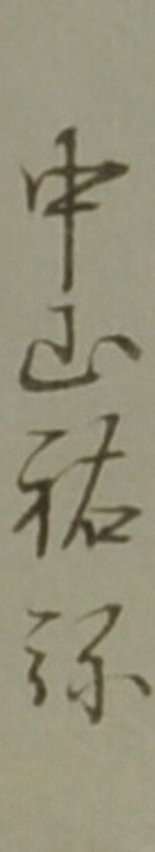中山祐弥
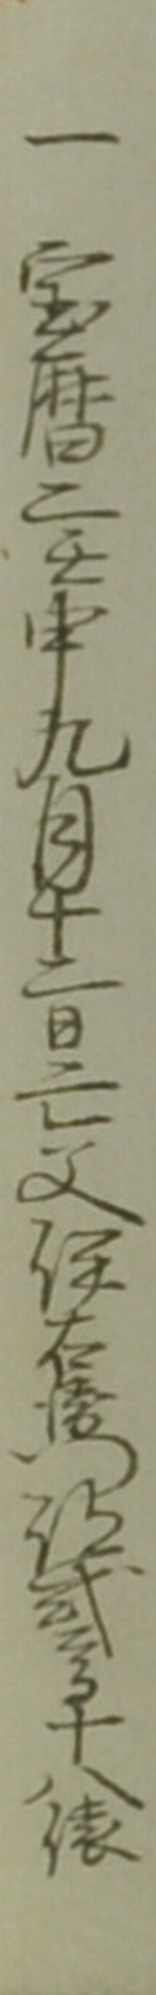一宝暦二壬申九月十二日亡父伊右衛門跡式高十八俵

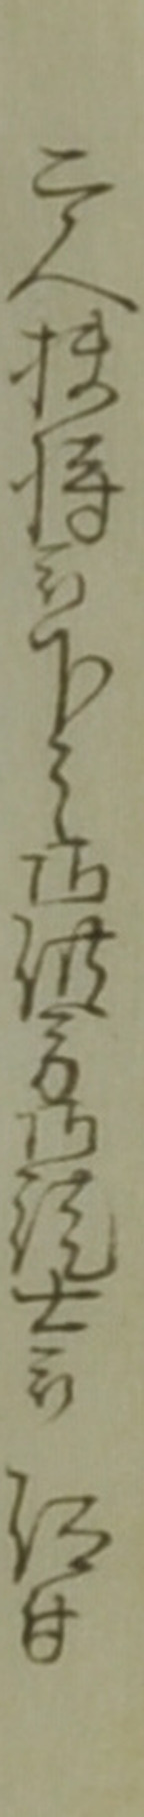二人扶持被下之御供方御徒士被仰付
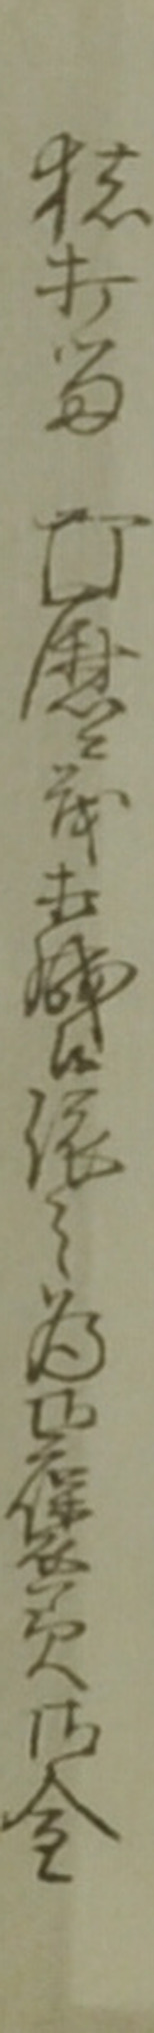猪打留御慰茂相成候依之為御褒美御金
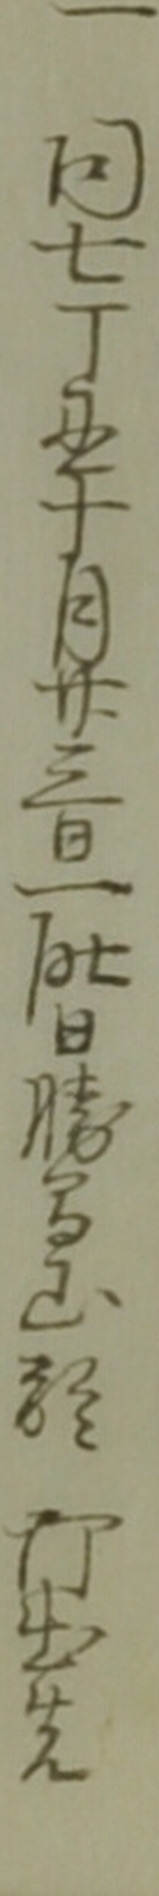一同七丁丑十月廿三日一昨日勝間山於御出先
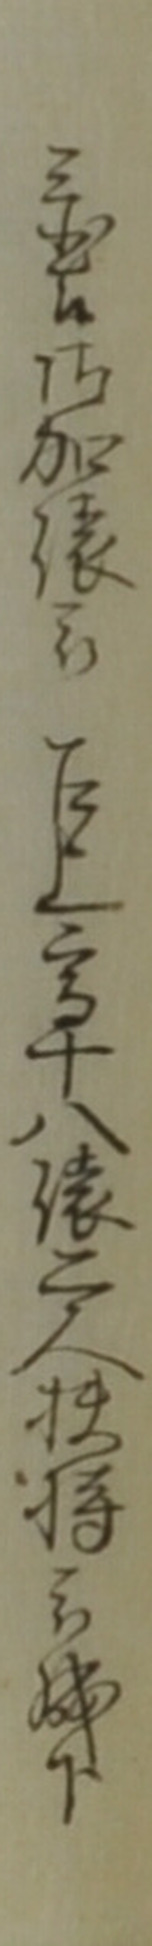置候御加俵被召上高十八俵二人扶持被成下
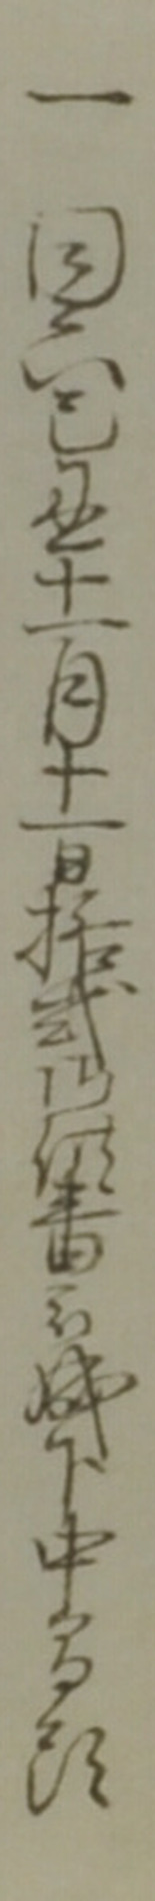一同六己丑十一月十一日格式御供番被成下中間頭
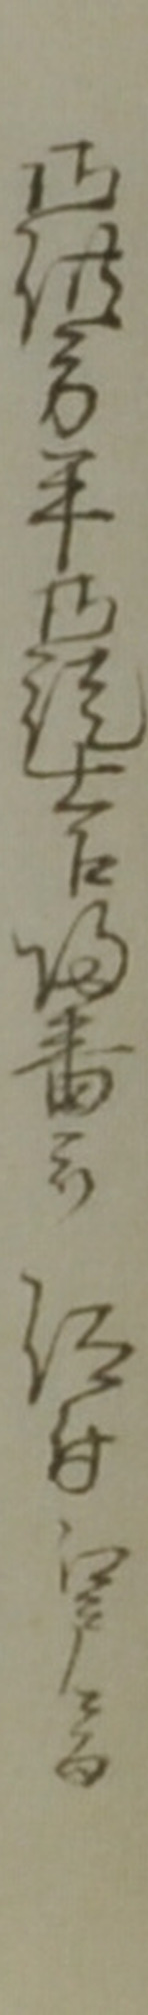御供方平御徒士江帰番被仰付江戸ニ而

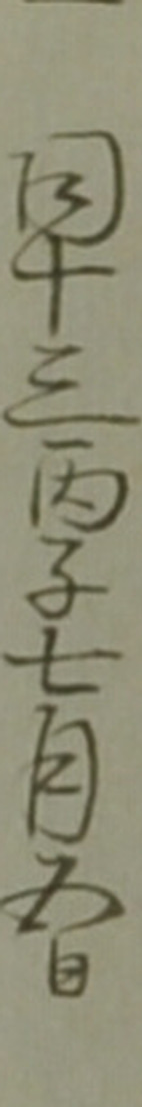一同十三丙子七月五日

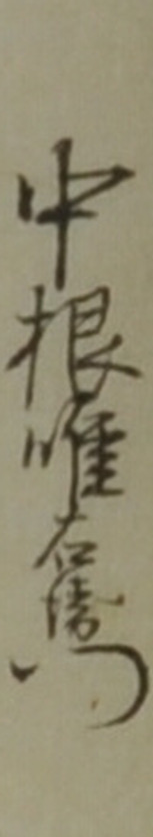中根唯右衛門
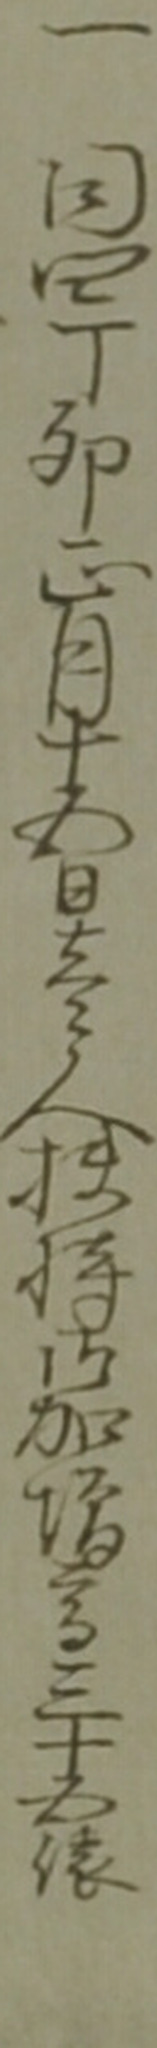一同四丁卯正月十五日壱人扶持御加増高三十五俵
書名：無足廃家（弐）
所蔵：伊那市立高遠町図書館・合同会社AMANE
